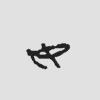女
